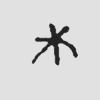木
